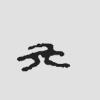亓（其）
